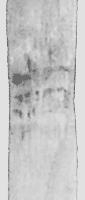{廿四}
